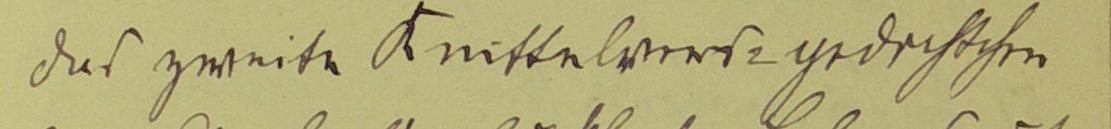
Das zweite Knittelvers Gedichtchen
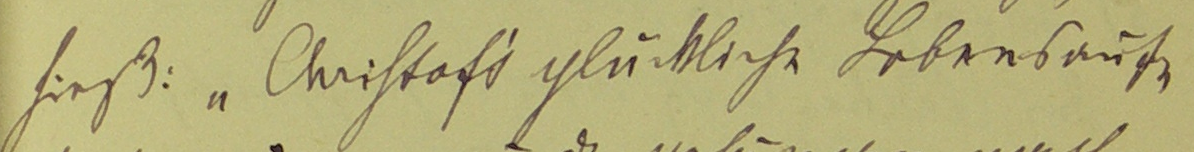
hieß: „ Christofs glückliche Lebensauf¬
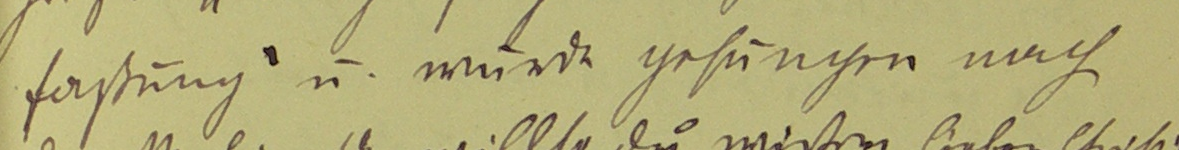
fassung und wurde gesungen nach
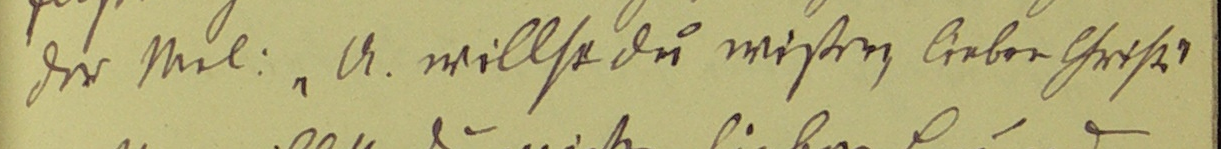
der Mel.: „U. willst du wissen lieber Christ „?
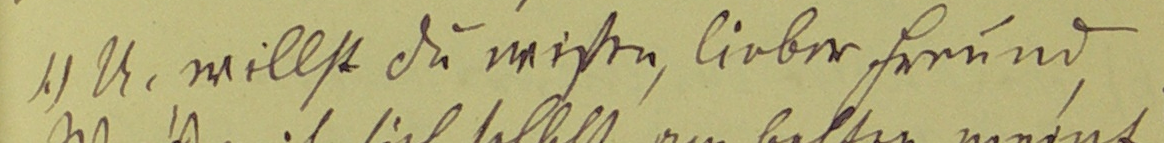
1) U. willst Du wißen, lieber Freund
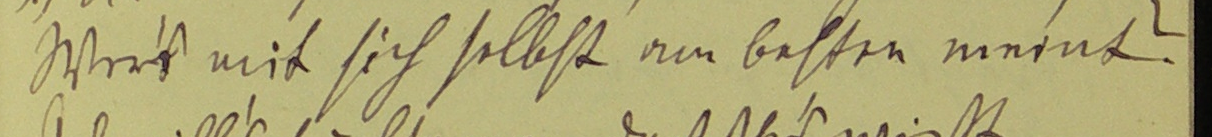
Wer's mit sich selbst am besten meint ?
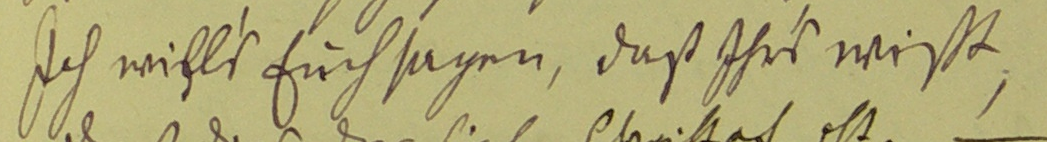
Ich will Euch sagen, dass Ihr's wißt,
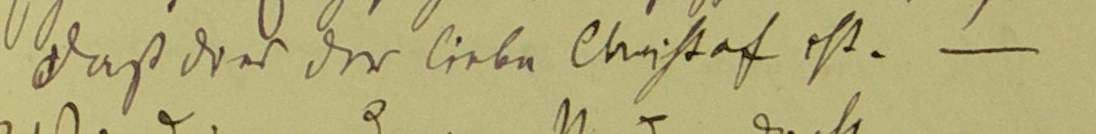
daß dies der liebe Christof ist. -
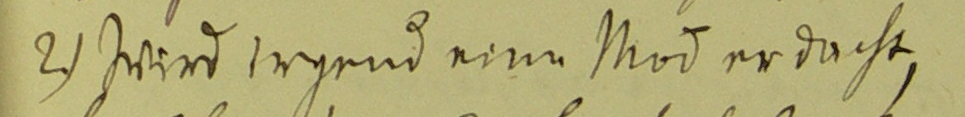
2) Wird irgend eine Mod erdacht
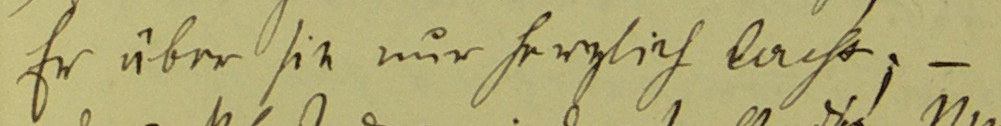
Er über sie nur herzlich lacht, -
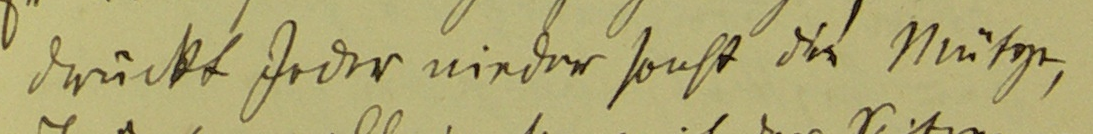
drückt Jeder nieder sonst die Mütze -
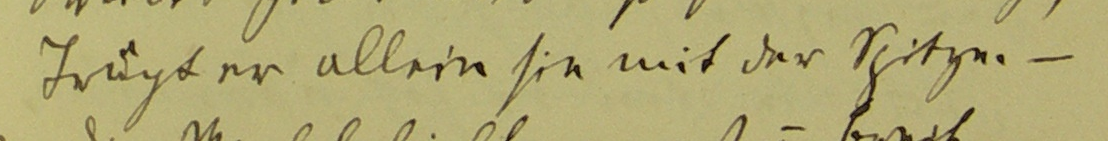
Trägt er allein sie mit der Spitze. -
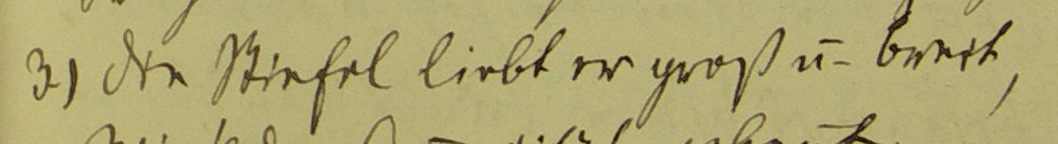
3) Die Stiefel liebt er groß und breit,
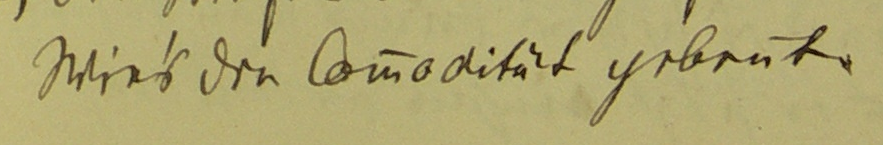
Wie's der Comodität gebeut.
